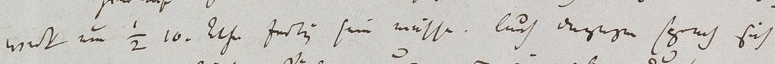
werk um ½ 10. Uhr fertig sein müsse. Auch dagegen sprach sich
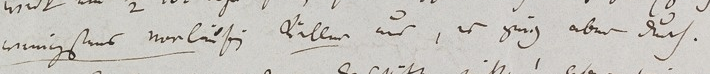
wenigstens vorläufig Keller aus, es ging aber durch.
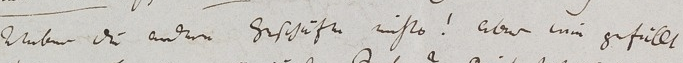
Ueber die andern Geschäfte nichts! Aber wie gefällt
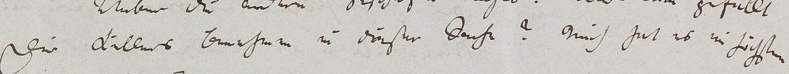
Dir Kellers Benehmen in dieser Sache? Mich hat es im höchsten
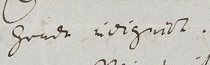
Grade indignirt.
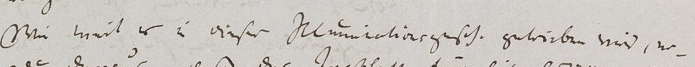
Wie weit es in dieser Illuminationsgesch. getrieben wird, er-
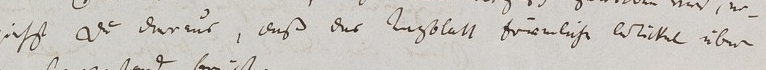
siehst Du daraus, daß das Tagblatt förmliche Artickel über
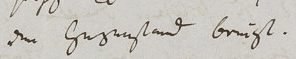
den Gegenstand bringt.
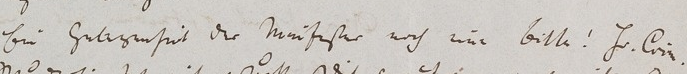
Bei Gelegenheit des Maifestes noch eine Bitte! Hr. Crim.
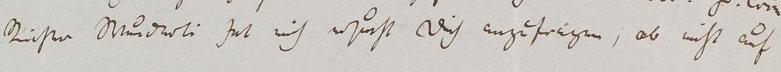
Richter Wunderli hat mich ersucht Dich anzufragen, ob nicht auf
